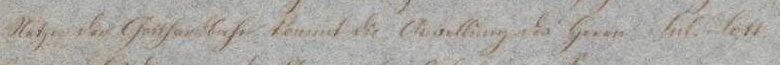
Netzes der Gotthardbahn kommt die Anstellung des Herrn Jul. Lott,
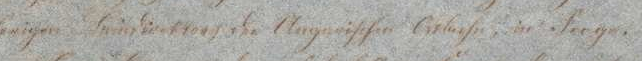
bisherigen Baudirektors der Ungarischen Ostbahn, in Frage.
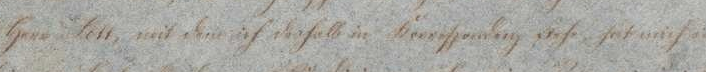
Herr Lott, mit dem ich deshalb in Korrespondenz stehe, hat mich er-
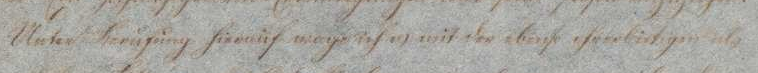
Unter Berufung hierauf wage ich es mit der ebenso ehrerbietigen als
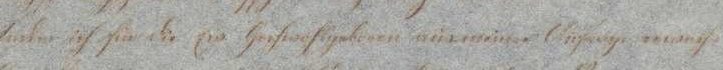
Indem ich für die Ew. Hochwohlgeboren aus meiner Anfrage erwach-
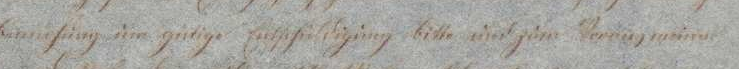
Bemühung um gütige Entschuldigung bitte und zum Voraus meinen
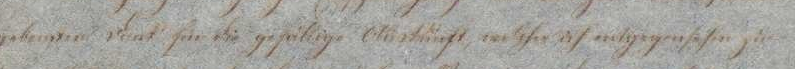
ergebensten Dank für die gefällige Auskunft, welcher ich entgegensehen zu
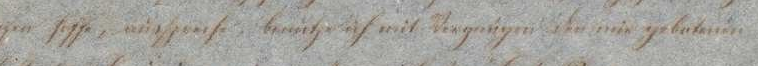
dürfen hoffe, ausspreche, benutze ich mit Vergnügen den mir gebotenen
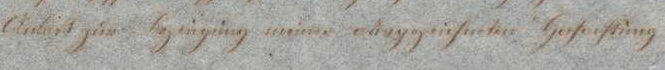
Anlaß zur Bezeugung meiner ausgezeichneten Hochachtung.
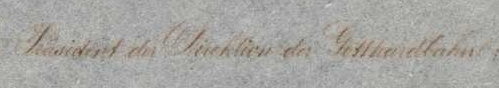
Präsident der Direktion der Gotthardbahn:
